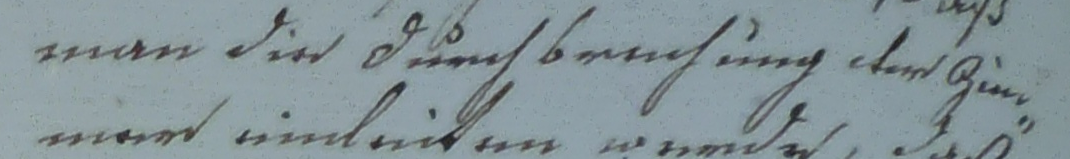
man die Durchbrechung der Zim¬
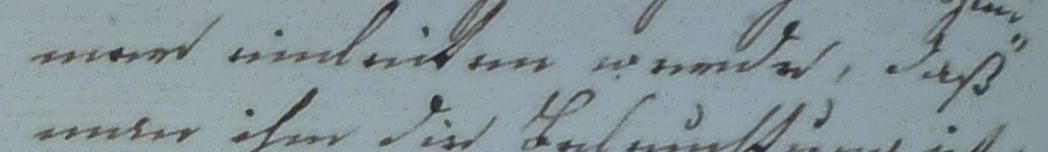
mer einleiten werde, daß
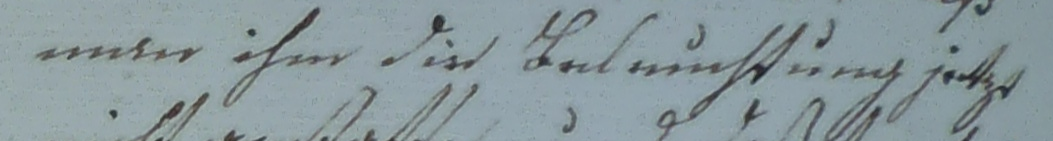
man ihm die Beleuchtung jetzt
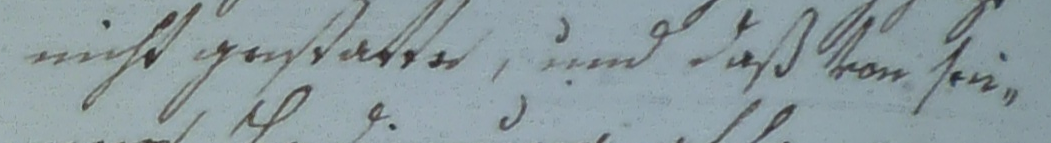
nicht gestatte, und daß von sei¬
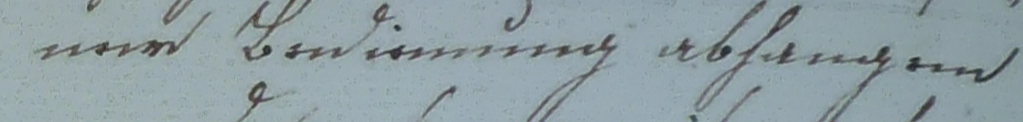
ner Bedienung abhangen
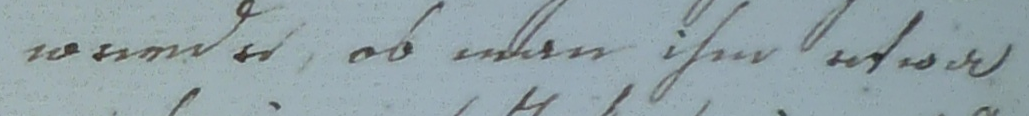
werde, ob man ihm etwa
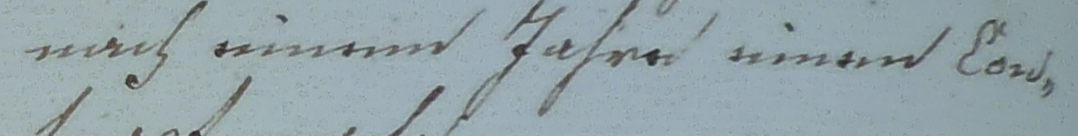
nach einem Jahre einen Con¬
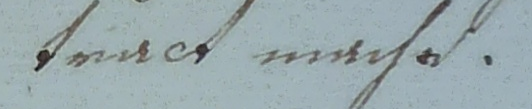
tract mache.
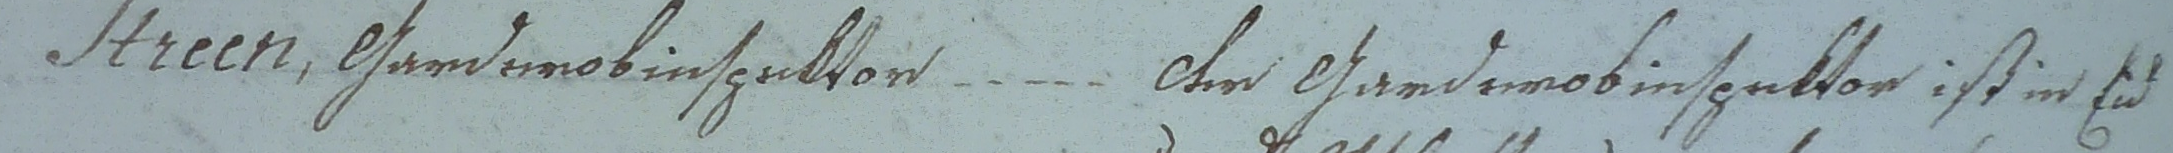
Streen, Garderobinspektor ….. Der Garderobinspektior ist in Eid
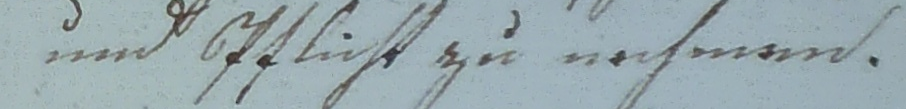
und Pflicht zu nehmen.
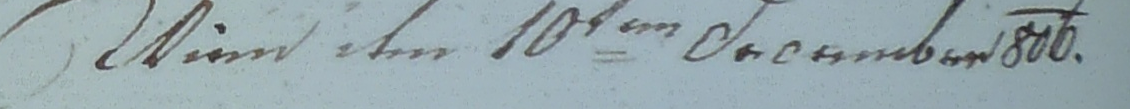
Wien den 10te͇n December 8͞0͞6.
